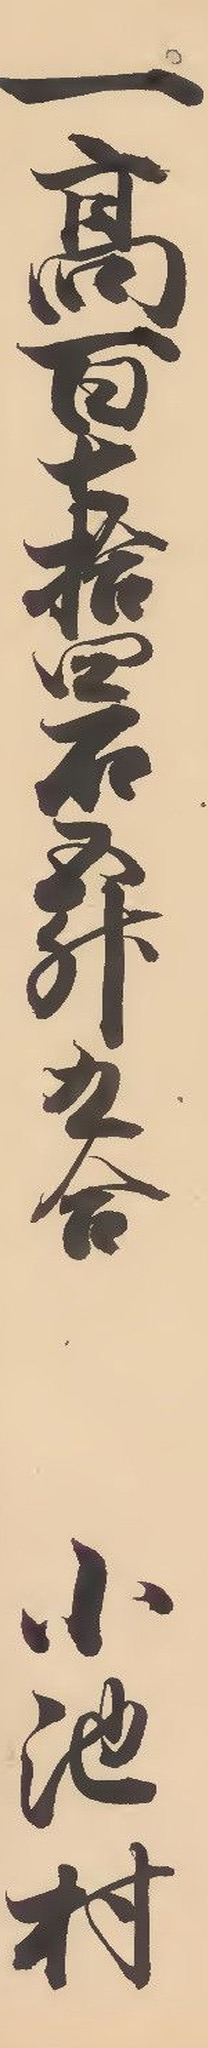一高百七拾四石五升九合小池村
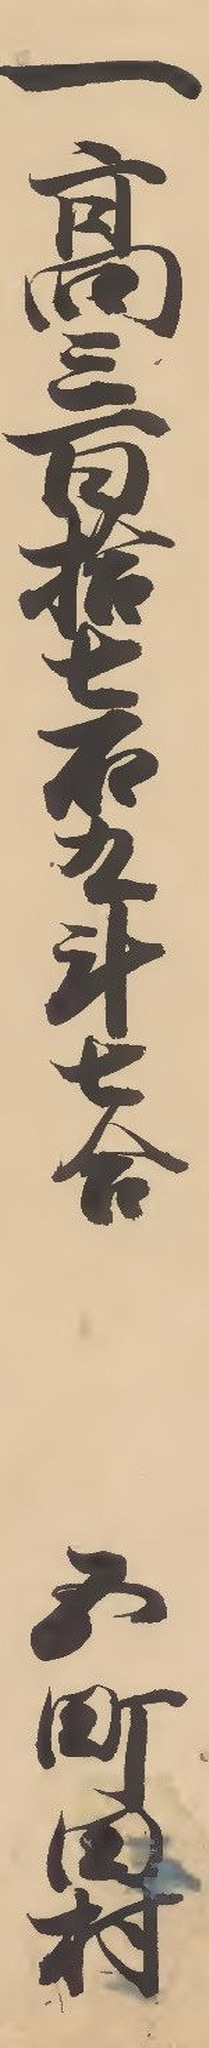一高三百拾七石九斗七合五町田村
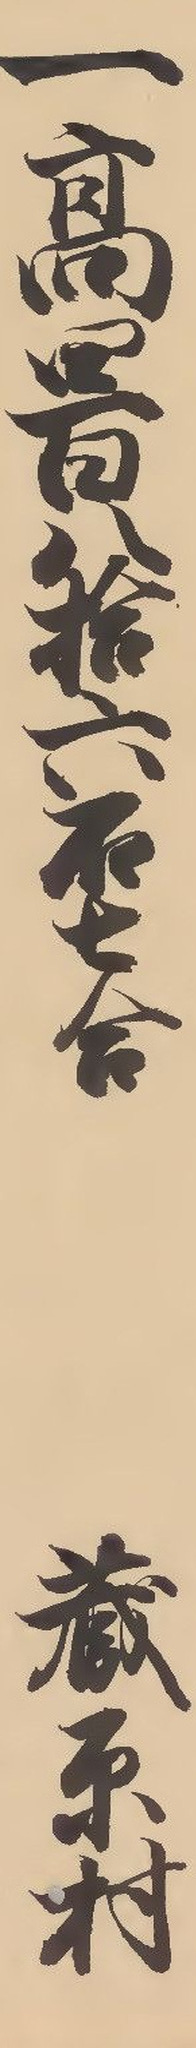一高四百八拾六石七合蔵原村
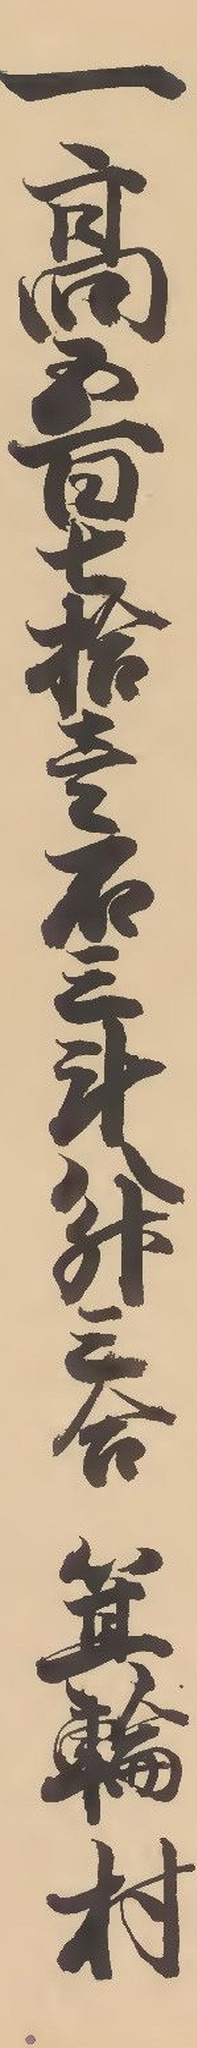一高五百七拾壱石三斗八升三合箕輪村

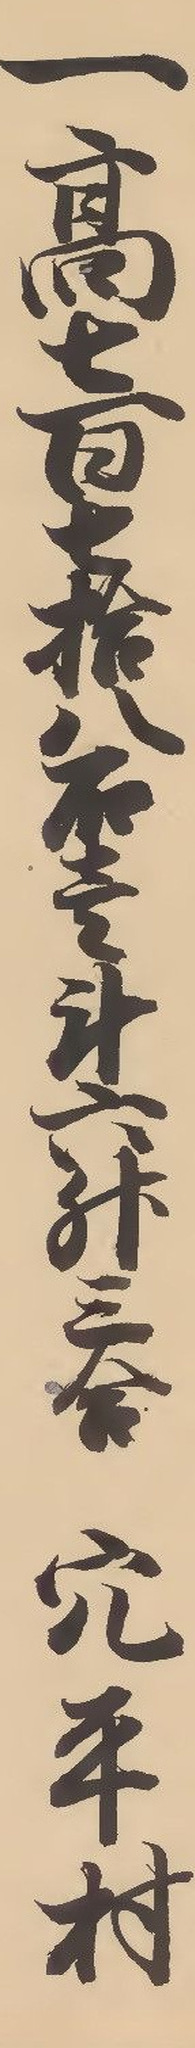一高七百七拾八石壱斗六升三合穴平村
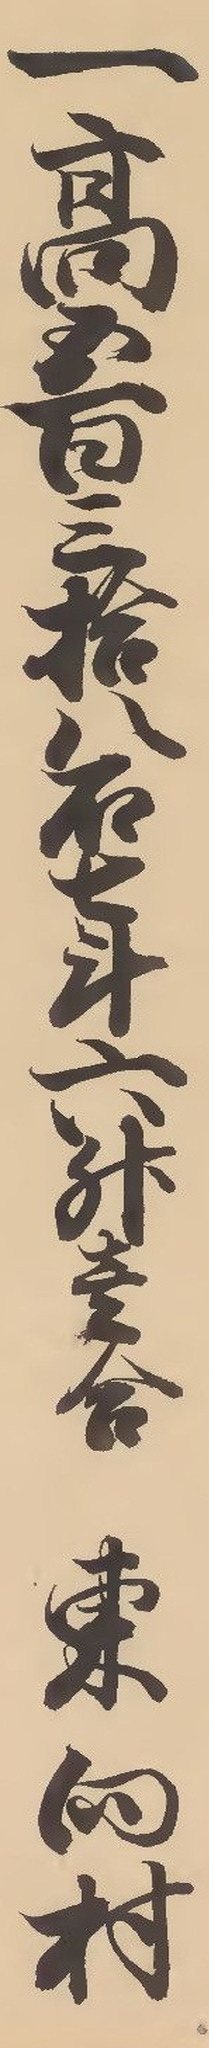一高五百三拾八石七斗六升壱合東向村
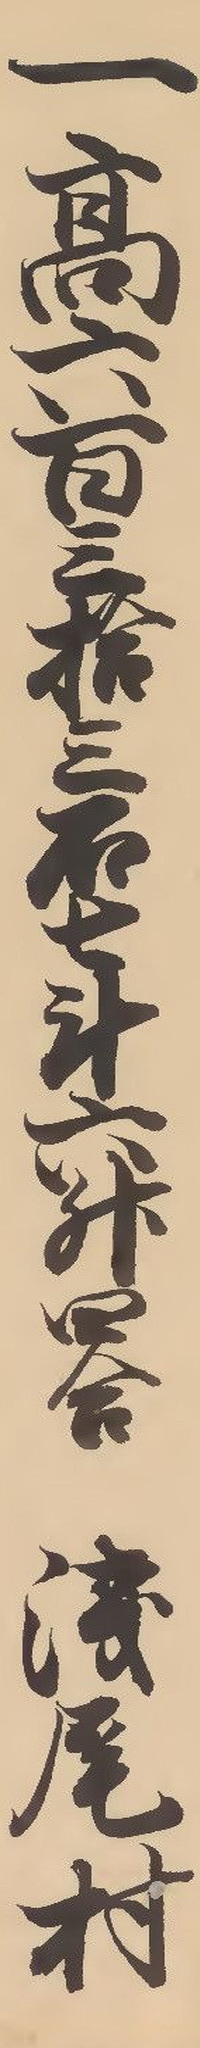一高六百三拾三石七斗六升四合浅尾村
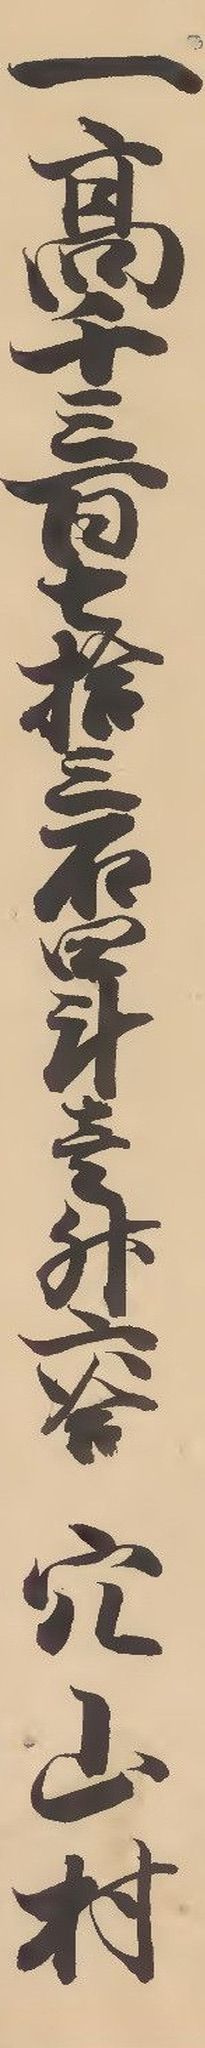一高千三百七拾三石四斗壱升六合穴山村
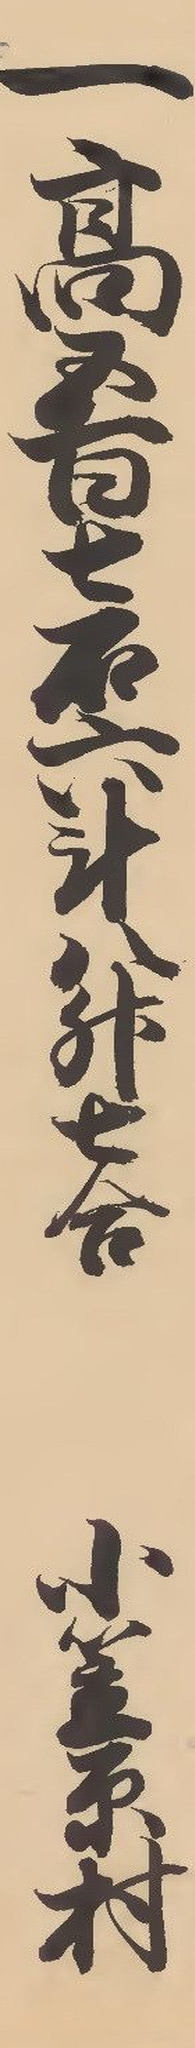一高五百七石六斗八升七合小笠原村
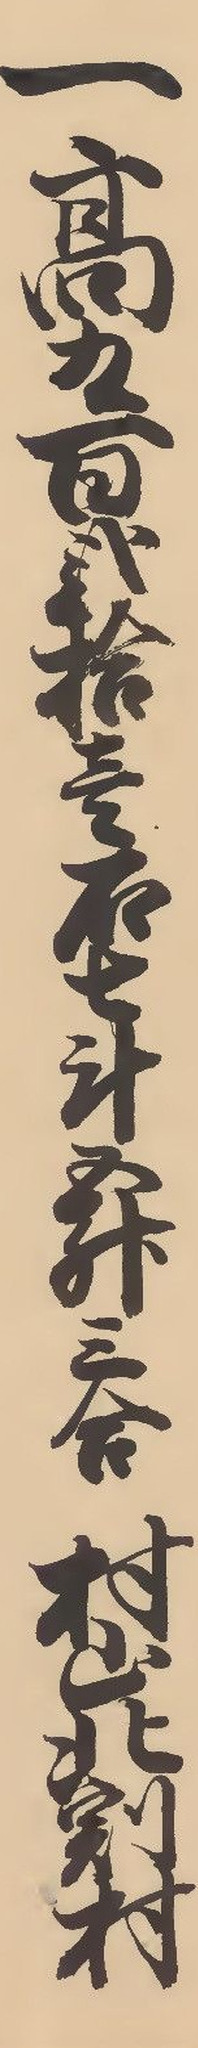一高九百弐拾壱石七斗五升三合村山北割村
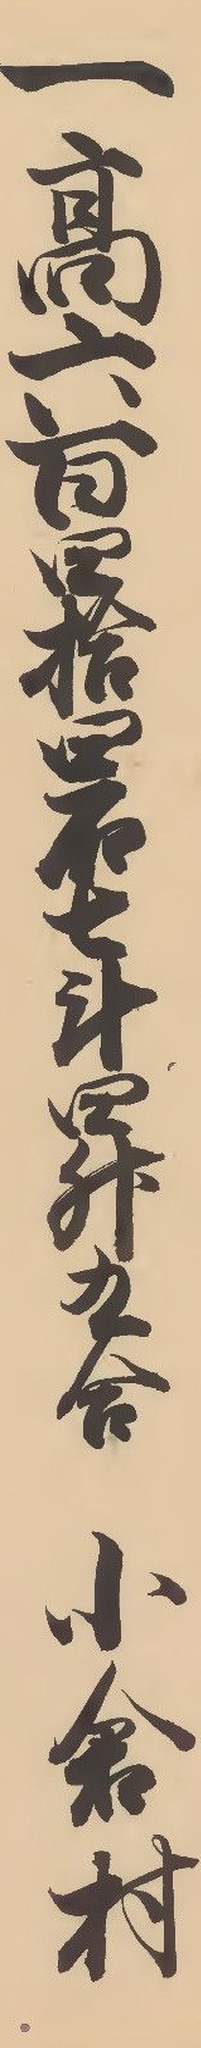一高六百四拾四石七斗四升九合小倉村
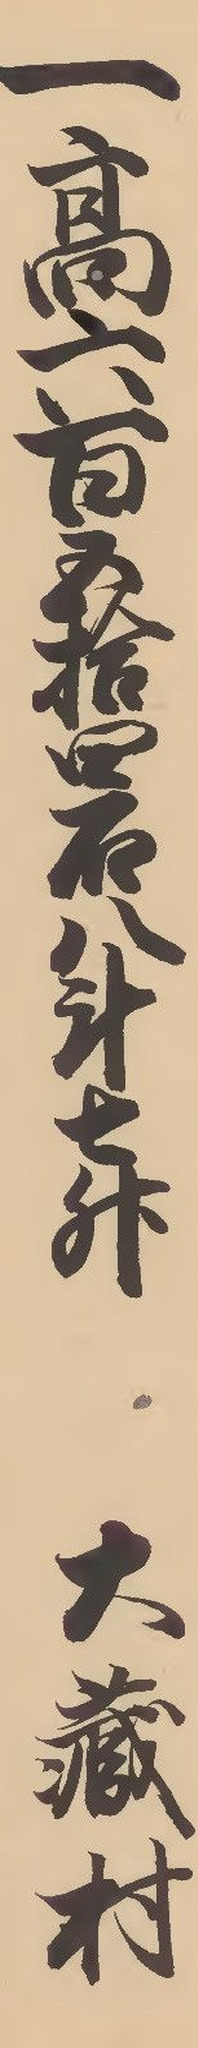一高六百五拾四石八斗七升大蔵村

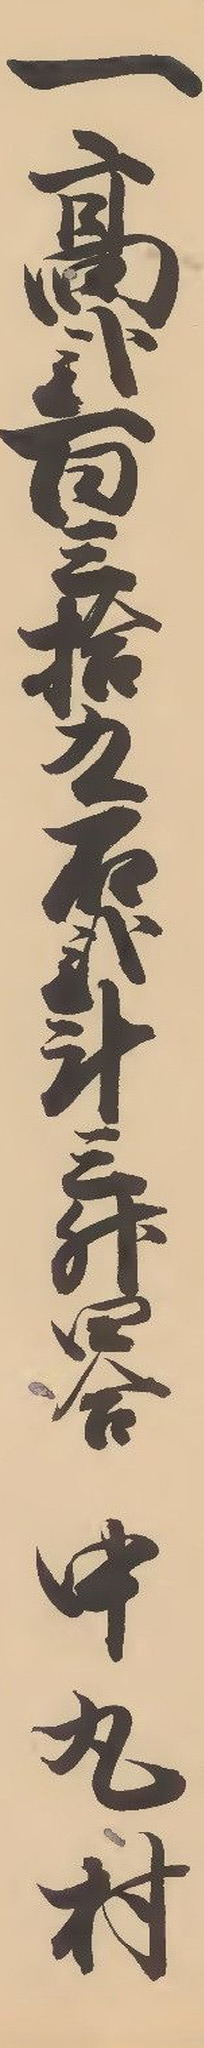一高弐百三拾九石弐斗三升四合中丸村
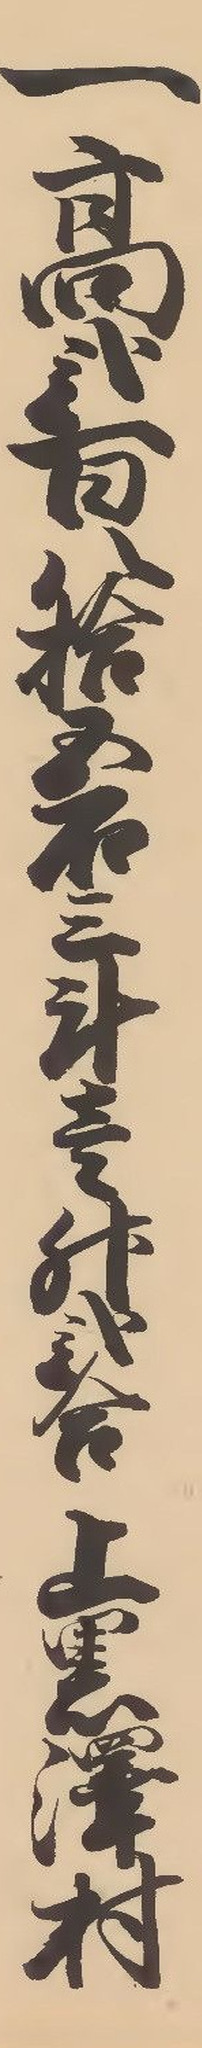一高弐百八拾五石三斗壱升弐合上黒沢村
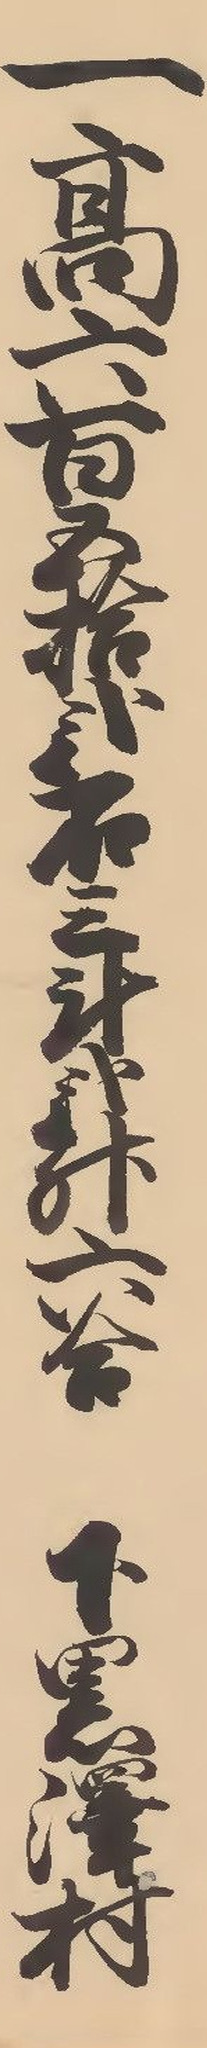一高六百五拾弐石三斗弐升六合下黒沢村
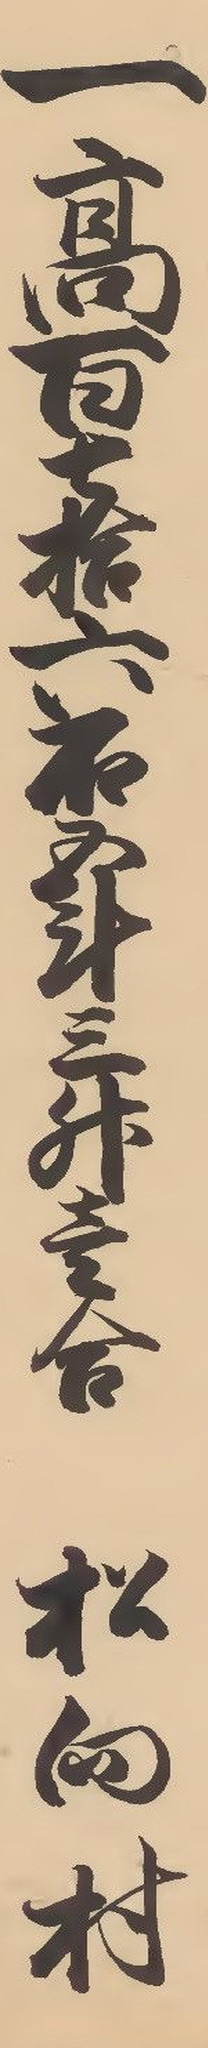一高百七拾六石五斗三升壱合松向村
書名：甲斐国郷帳
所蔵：国立公文書館 National Archives of Japan
